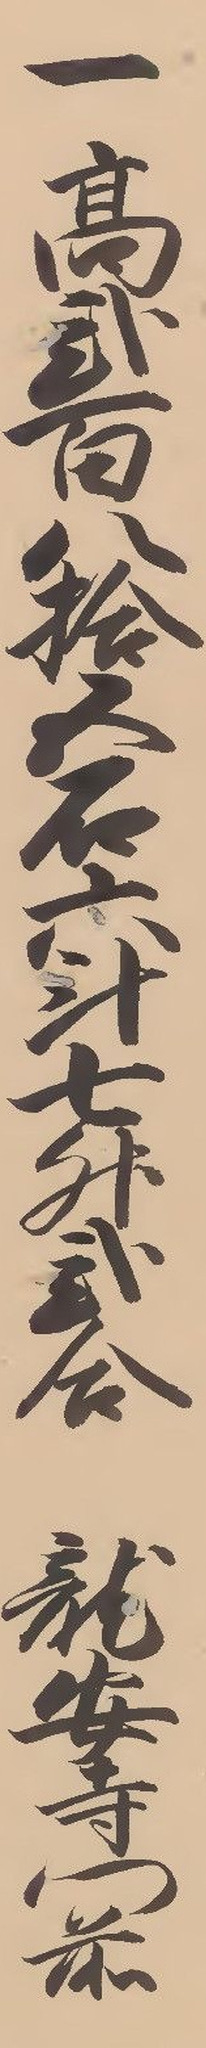一高弐百八拾五石六斗七升弐合竜安寺門前
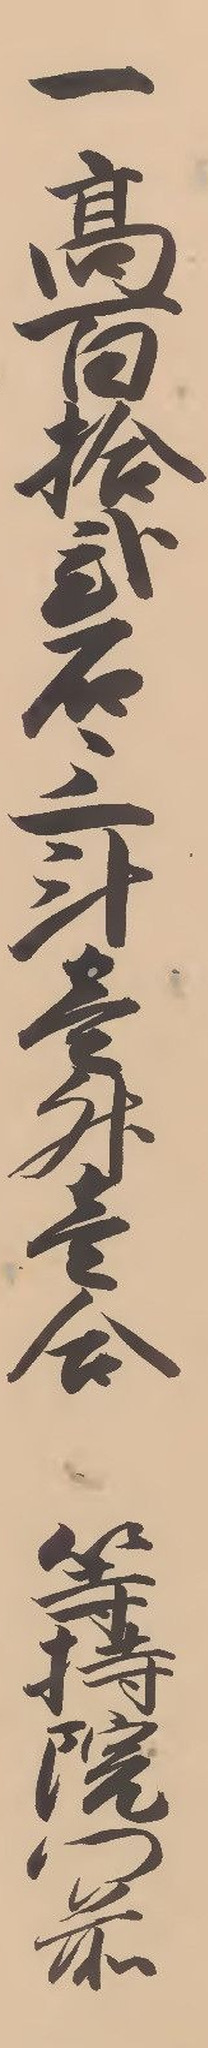一高百拾弐石三斗壱升壱合等持院門前
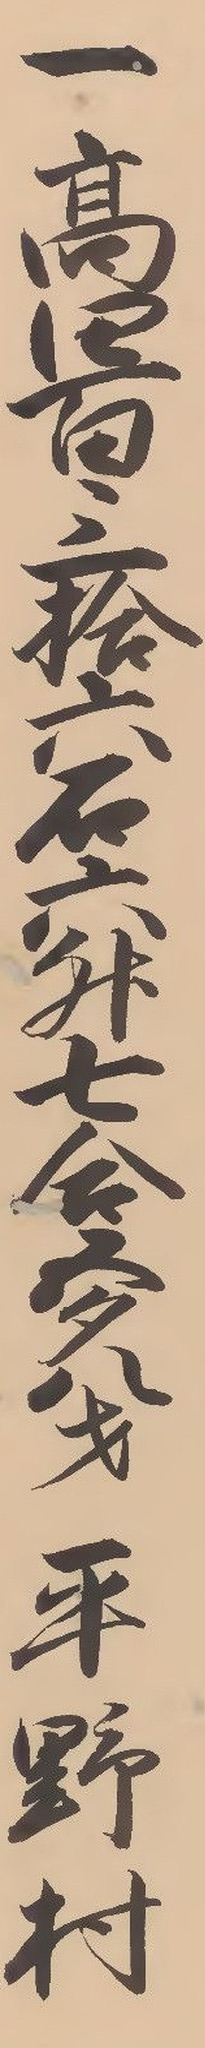一高四百三拾六石六升七合五勺八才平野村

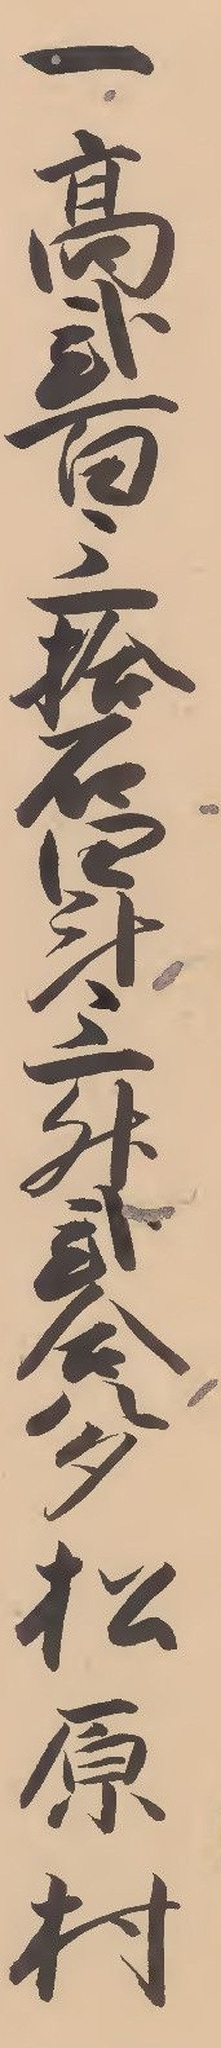一高弐百三拾石四斗三升弐合八勺松原村
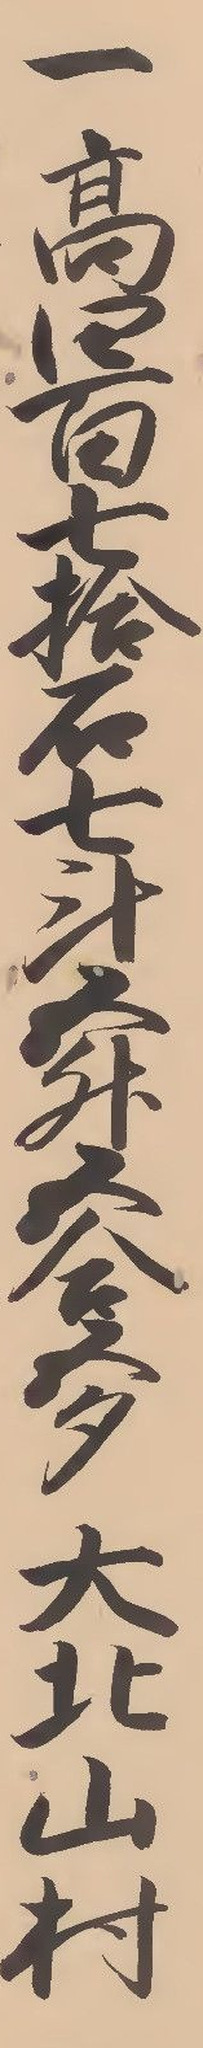一高四百七拾石七斗五升五合五勺大北山村
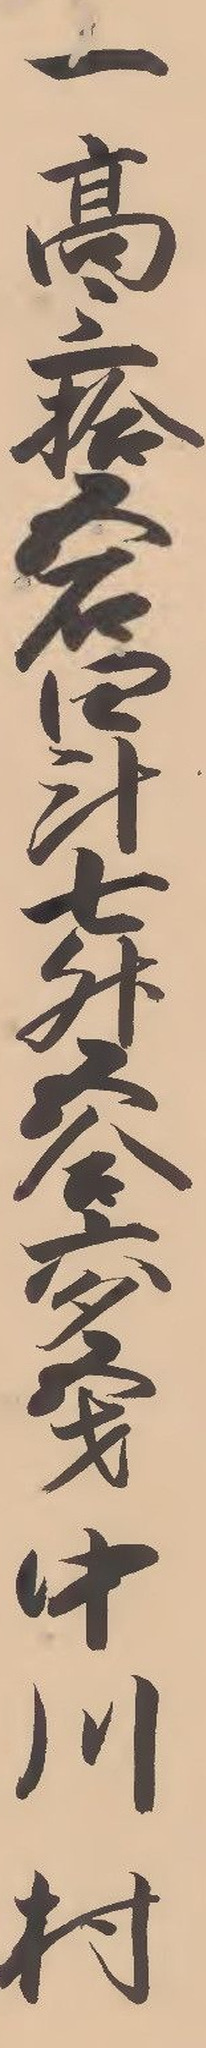一高三拾五石四斗七升五合六勺五才中川村
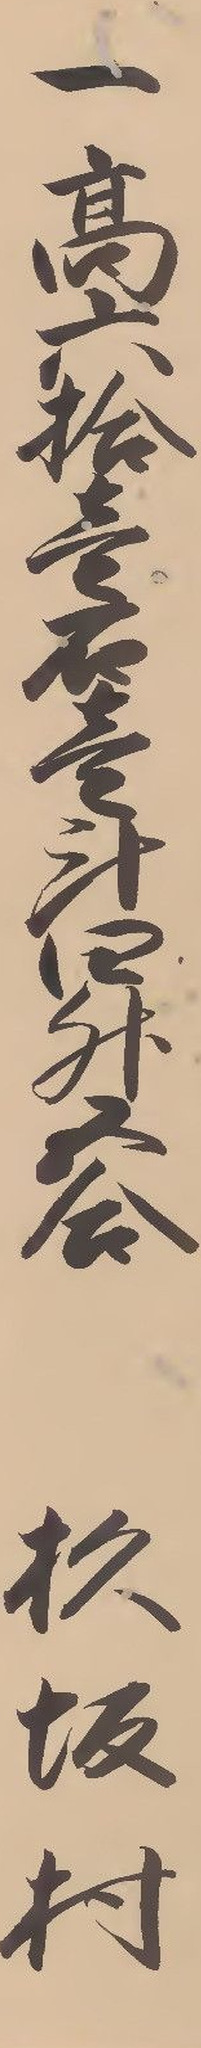一高六拾壱石壱斗四升五合杉坂村
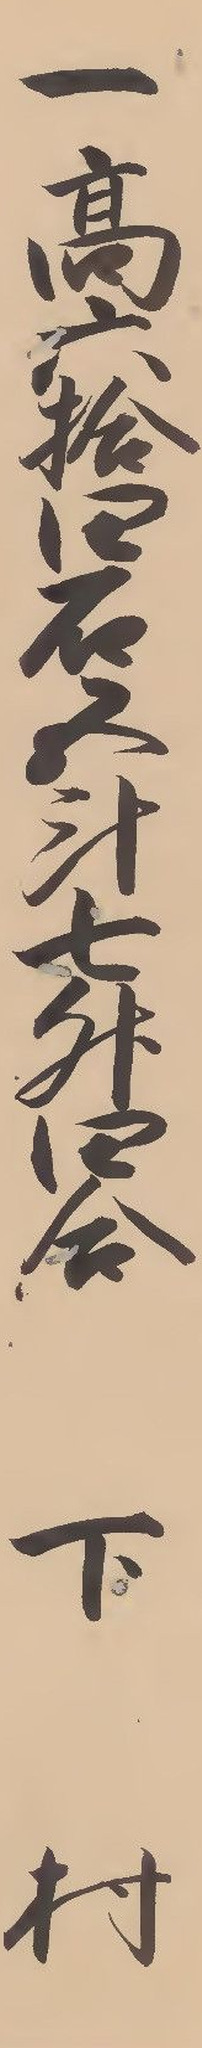一高六拾四石五斗七升四合下村
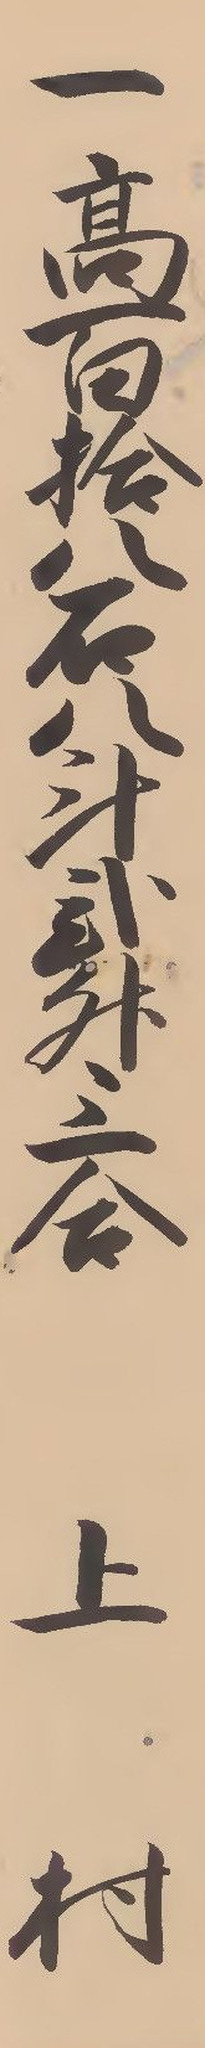一高百拾八石八斗弐升三合上村
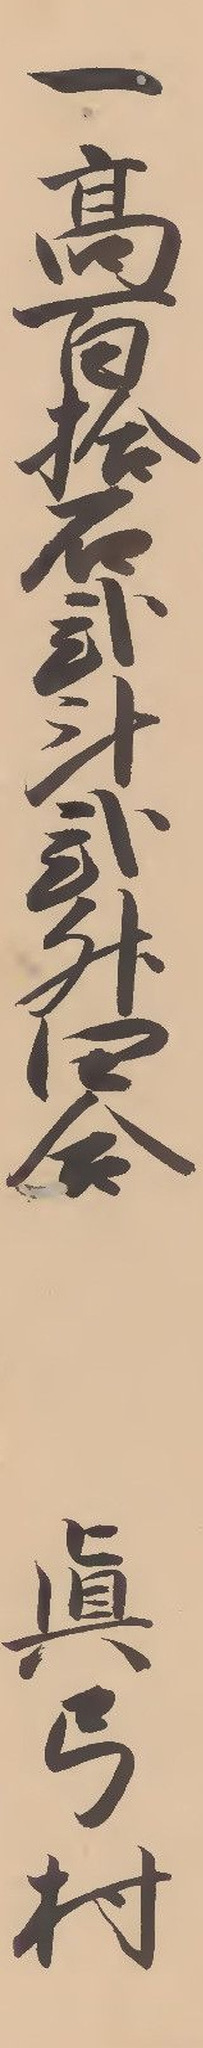一高百拾石弐斗弐升四合真弓村

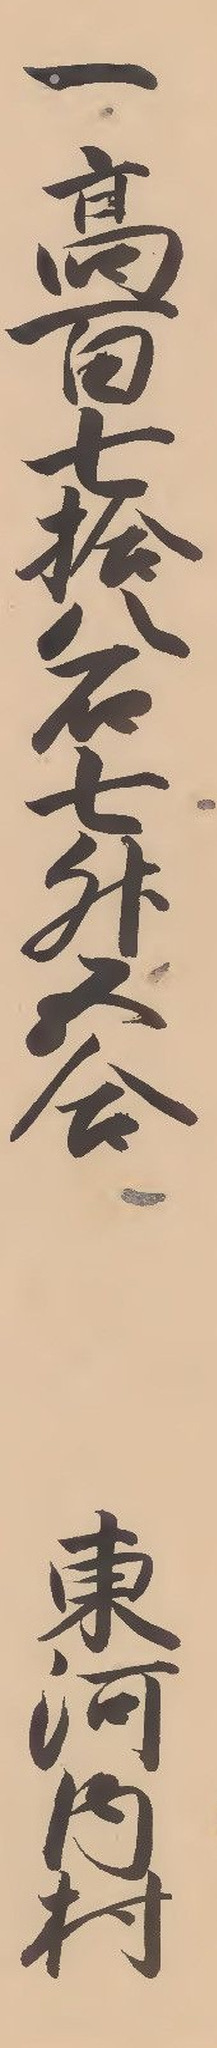一高百七拾八石七升五合東河内村
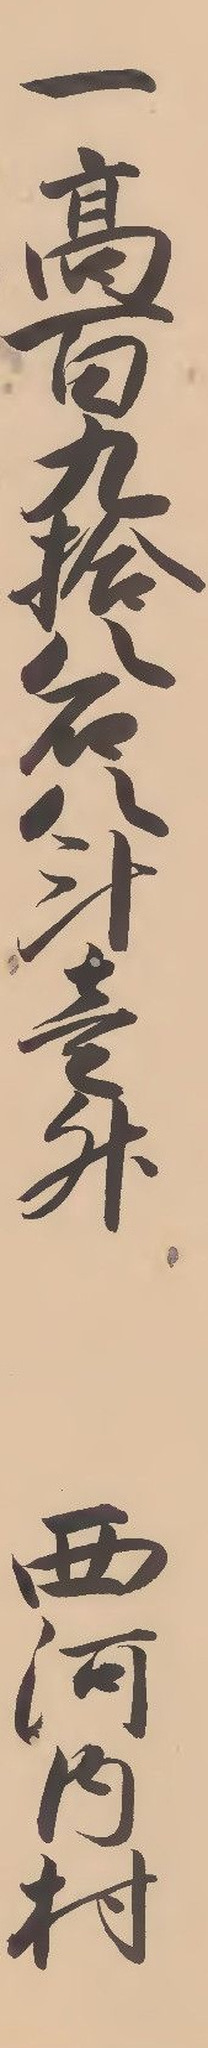一高百九拾八石八斗壱升西河内村
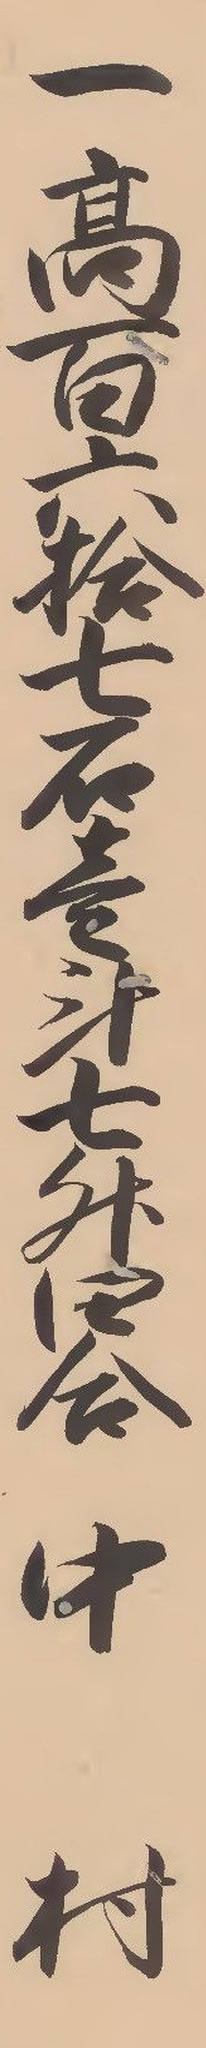一高百六拾七石壱斗七升四合中村
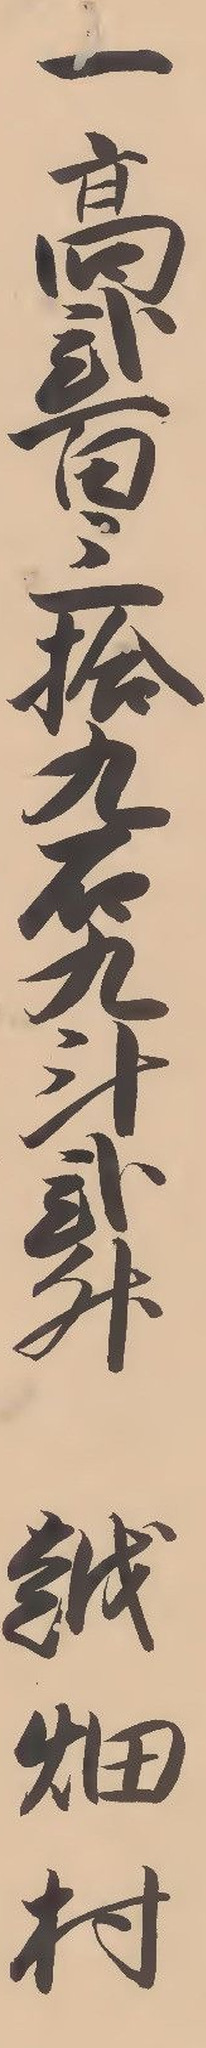一高弐百三拾九石九斗弐升越畑村
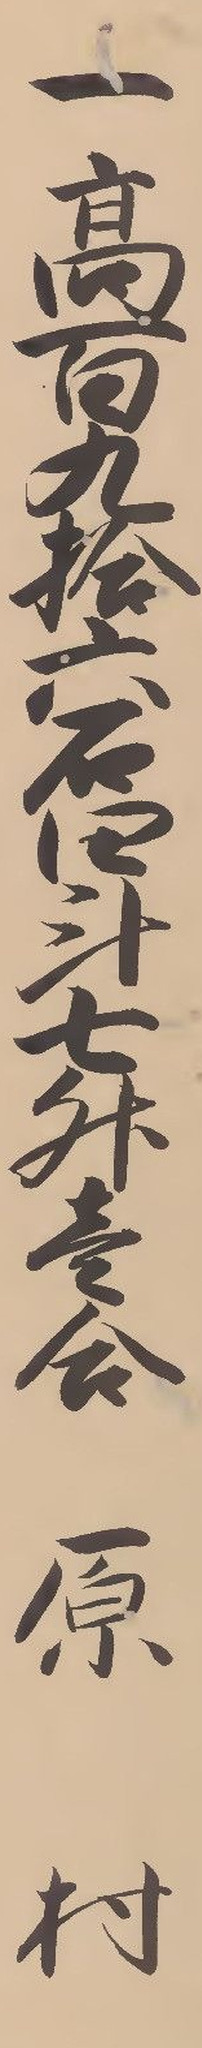一高百九拾六石四斗七升壱合原村
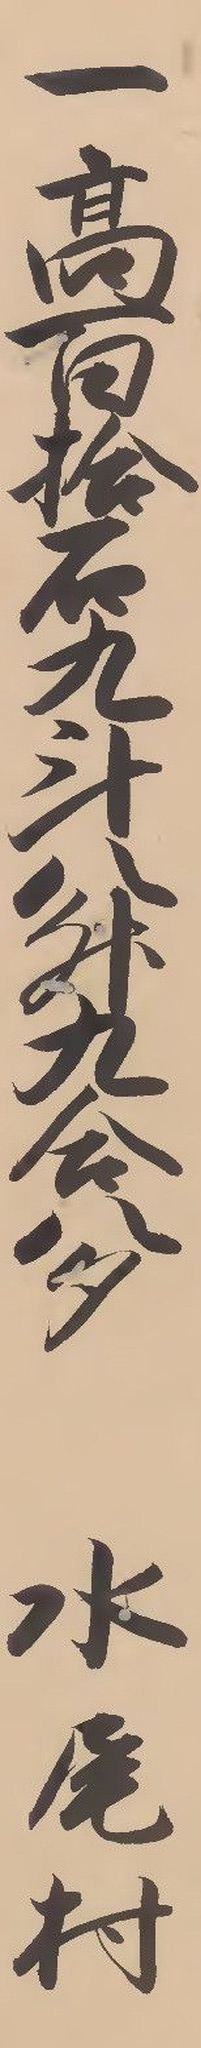一高百拾石九斗八升九合八勺水尾村
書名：山城国郷帳
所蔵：国立公文書館 National Archives of Japan
